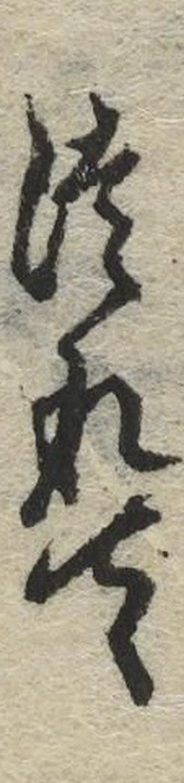つれて
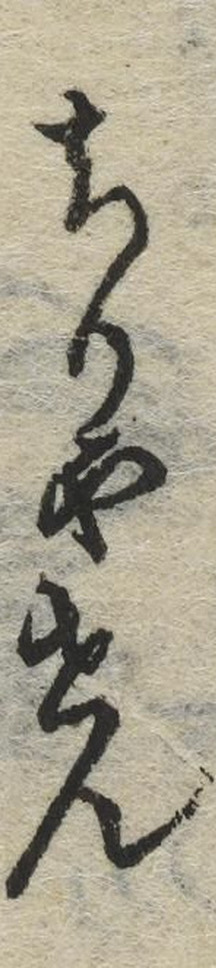ちりやせん
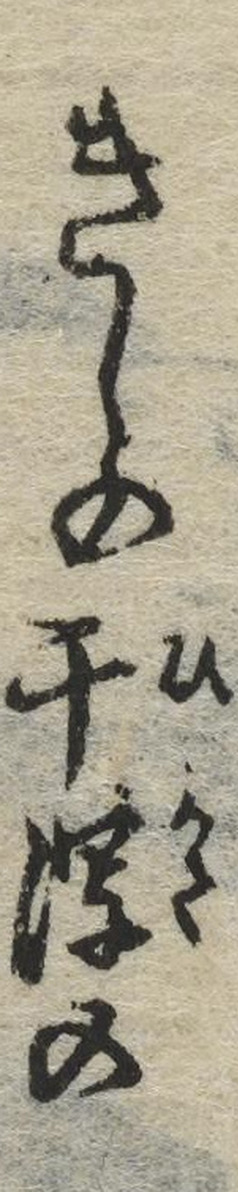きしの干潟の
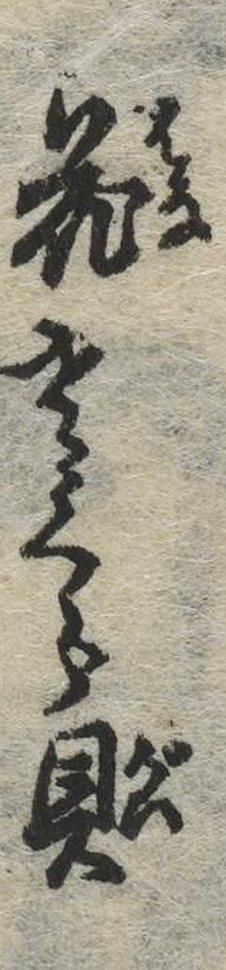花さくら貝
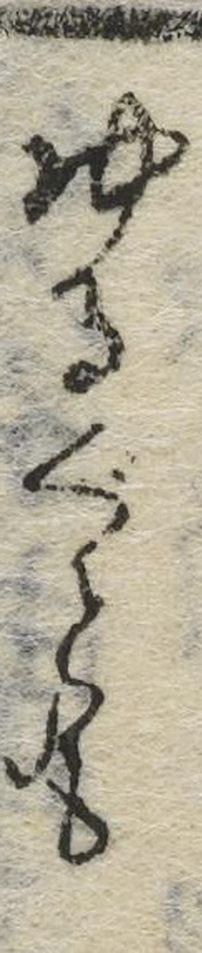ゆるぐとも
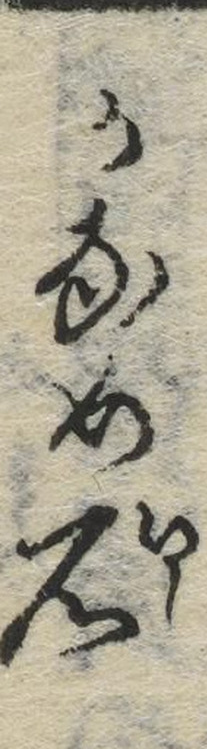かなめ石
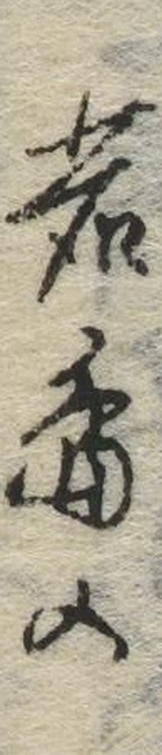鹿島の
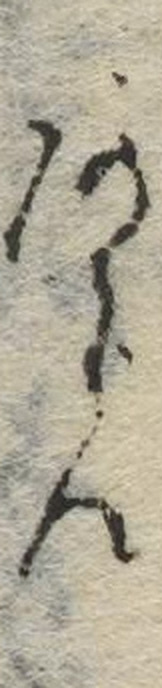あらん
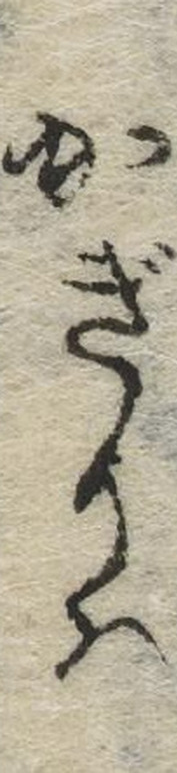かぎりは

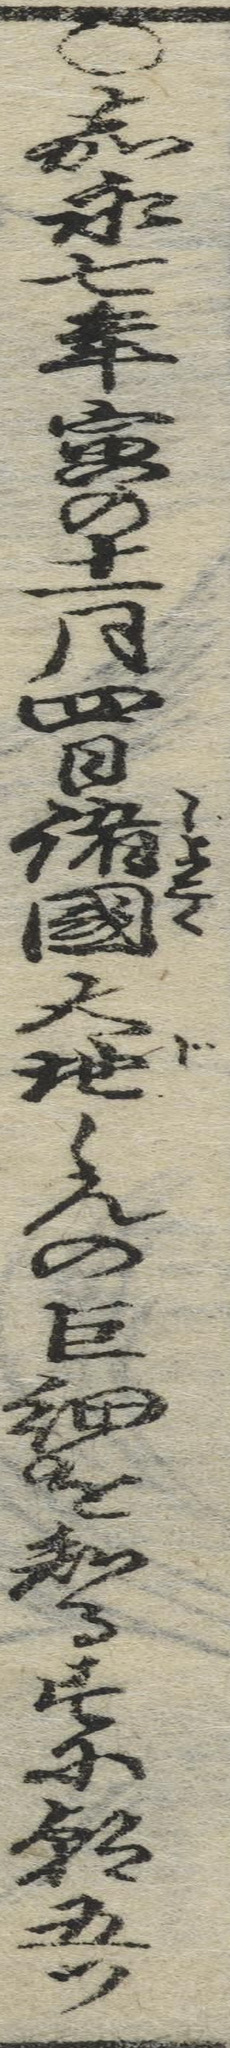○嘉永七年寅の十一月四日諸国大地しんの巨細を知るすに朝五ツ
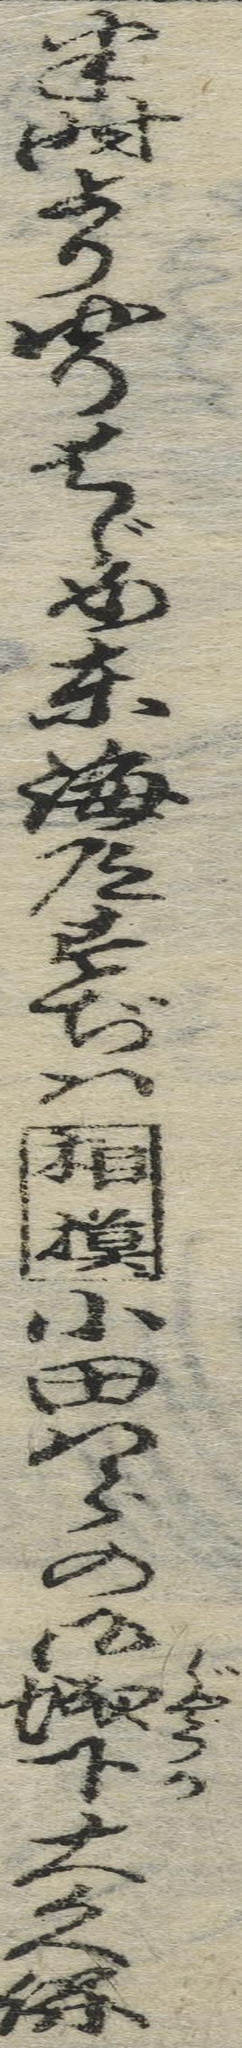半時よりゆりはじめ東海道すぢは相模小田はらの御城下大久保
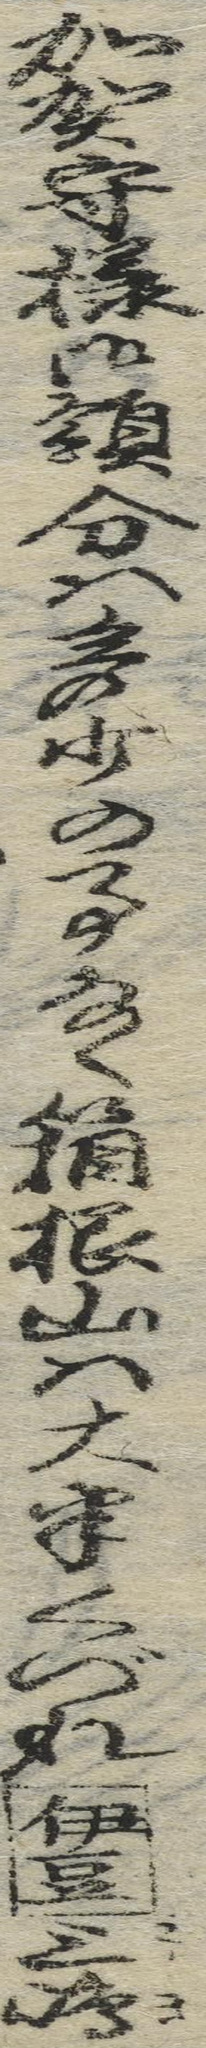加賀守様御領分は多少の事なく箱根山は大半くづれ伊豆三嶋
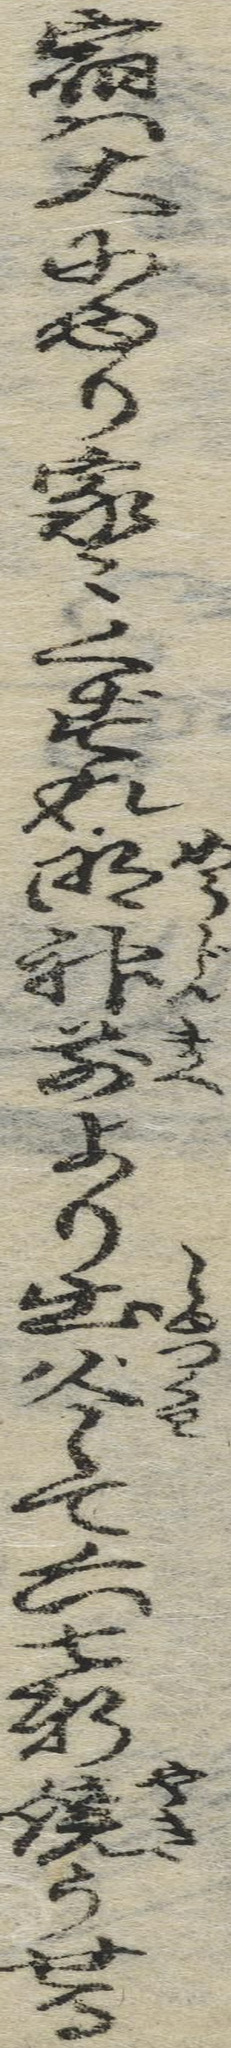宿は大にゆり家々くずれ明神前より出火して六七軒焼うせる
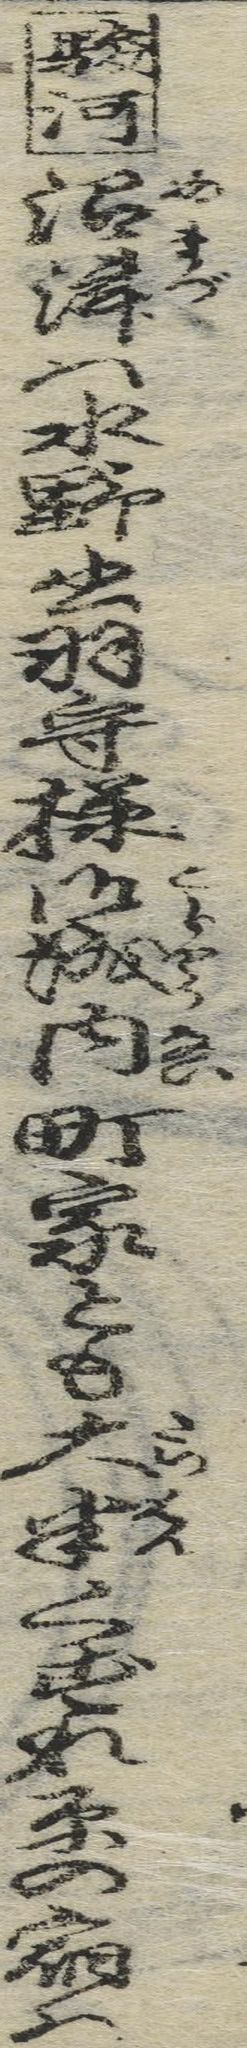駿河沼津は水野出羽守様御城内町家とも大半くずれ原の宿は
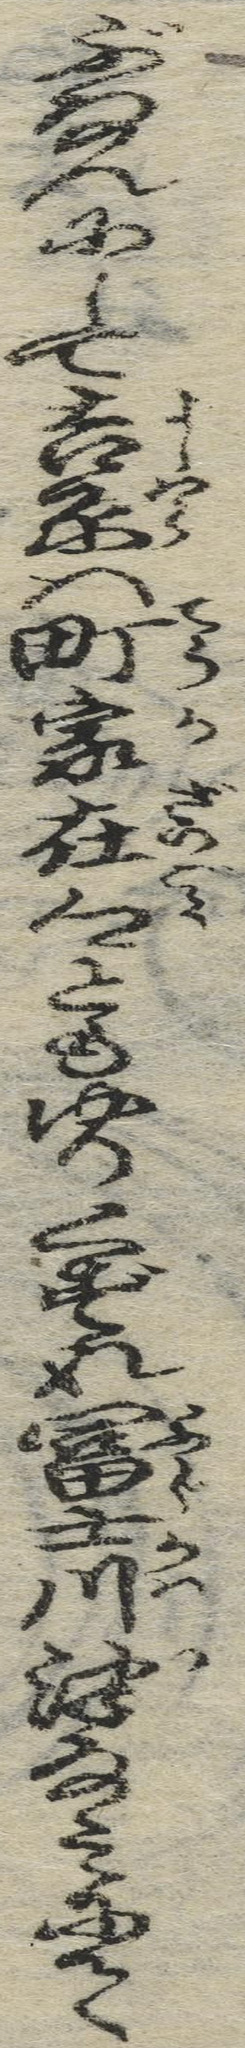ぶなんにして吉原は町家在郷ともゆりくずれ富士川津なみにて
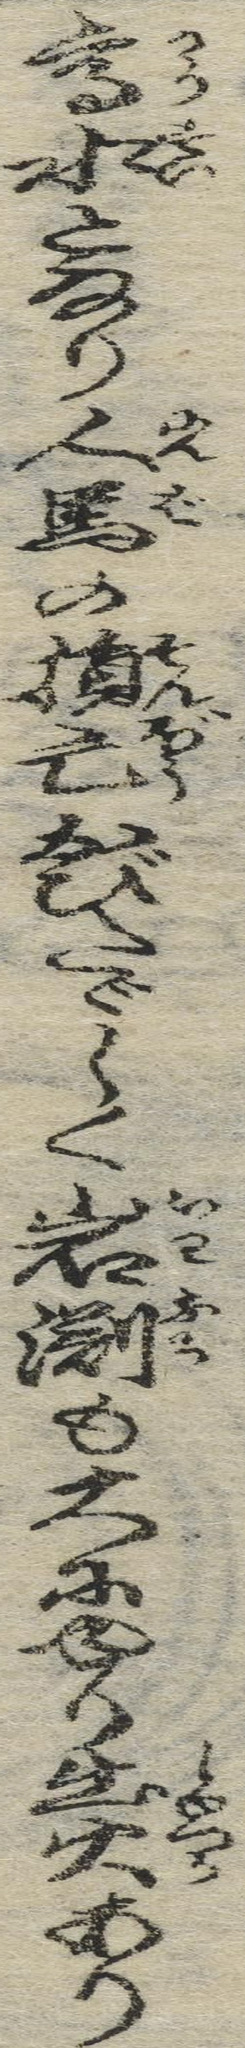高水となり人馬の損亡おびたゞしく岩渕も大にゆり出火あり
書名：諸国海辺地震津波書
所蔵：東京大学地震研究所図書室 Earthquake Research Institute Library, The University of Tokyo, JAPAN
